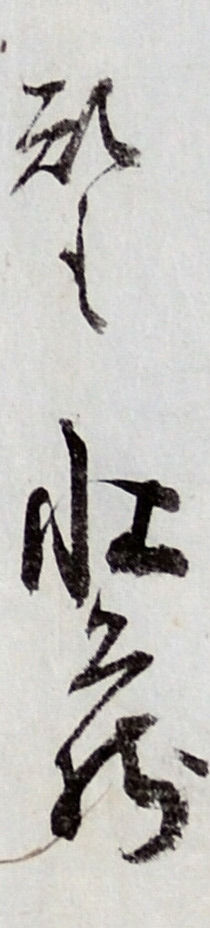願主壮蔵
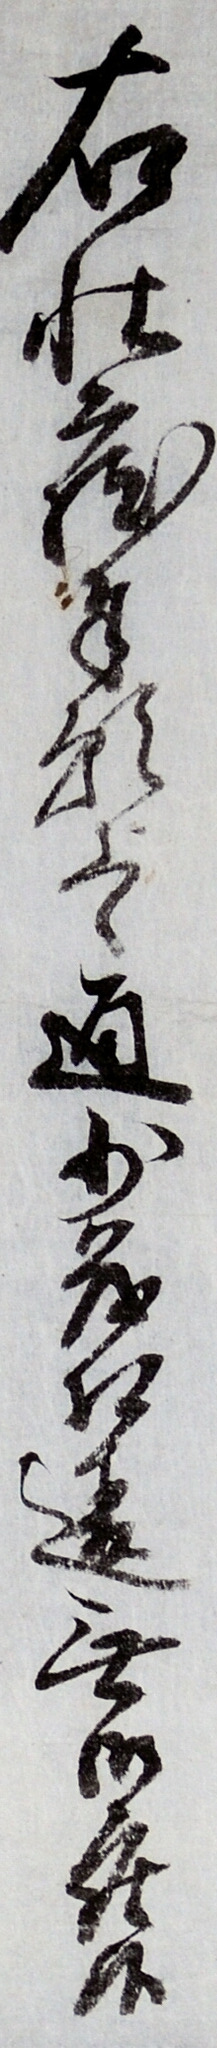右壮蔵奉願上候通少も相違無御座候
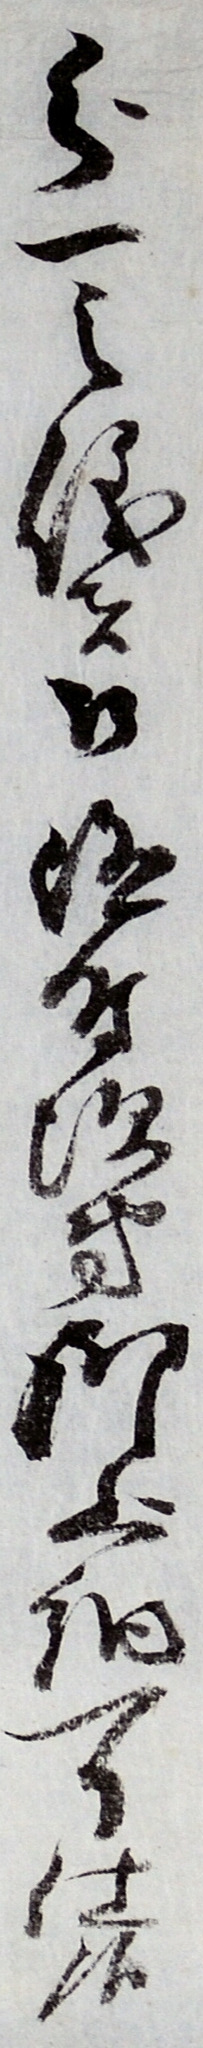分一之儀は被仰付次第御上納可仕候
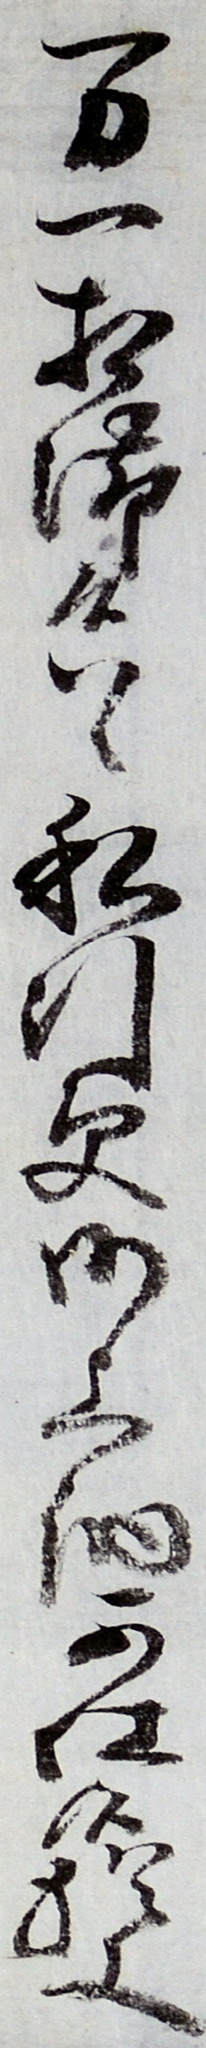万一相滞候はゝ私引受御上納可仕候猶又
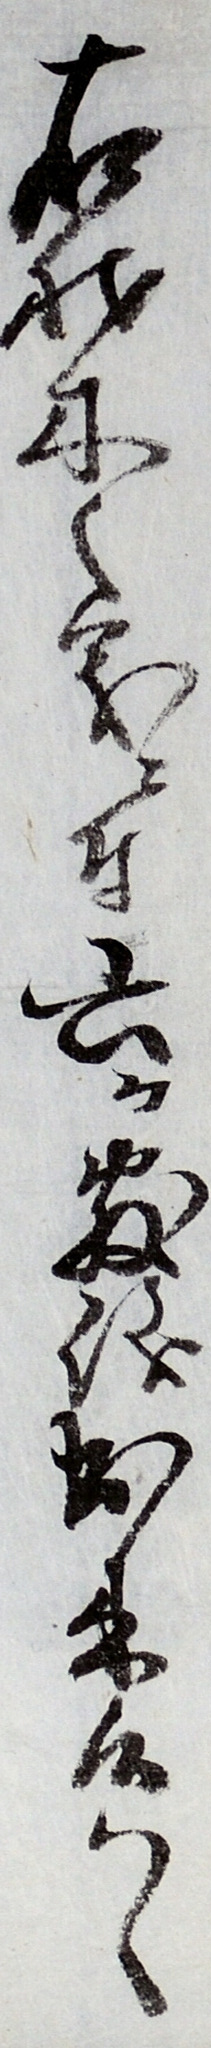右材木之義に付六ヶ敷儀出来候はゝ
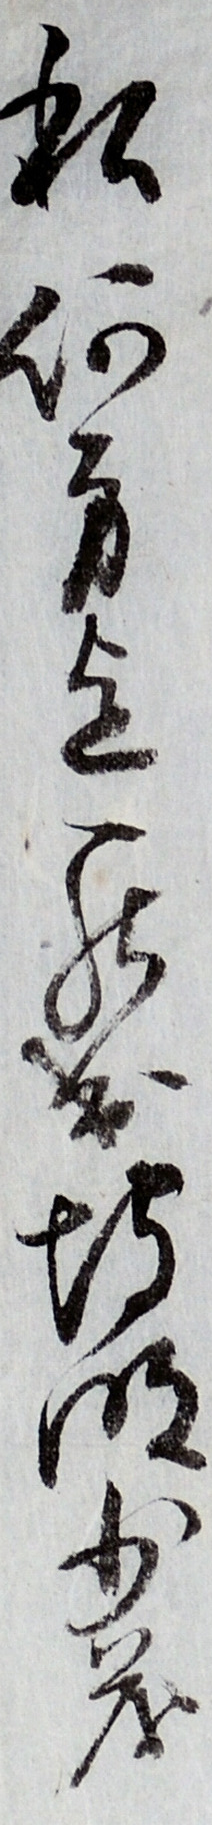私何方迄罷出埒明少も
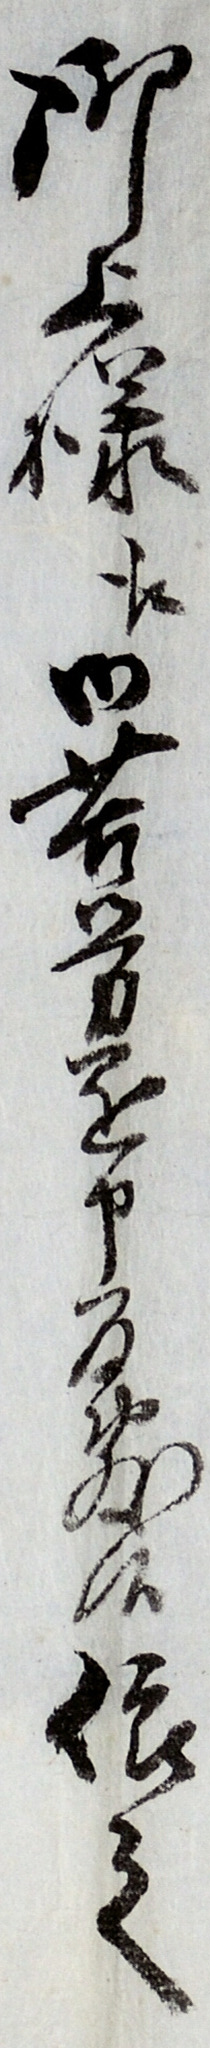御上様え御苦労懸申間敷候依之
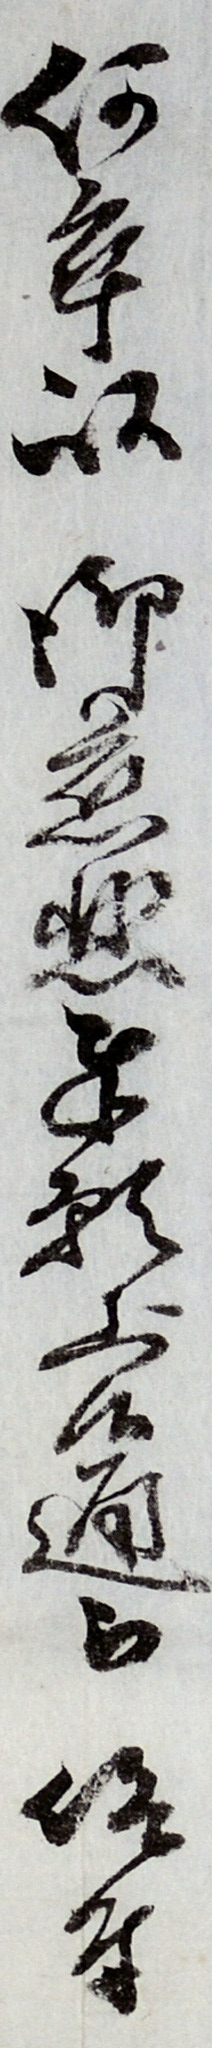何卒以御慈悲奉願上候通被仰付
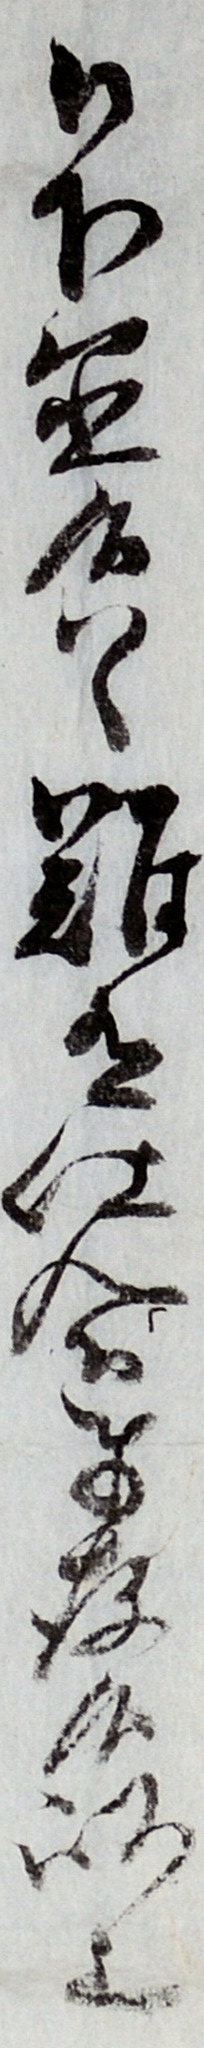被下置候はゝ難有仕合奉存候以上
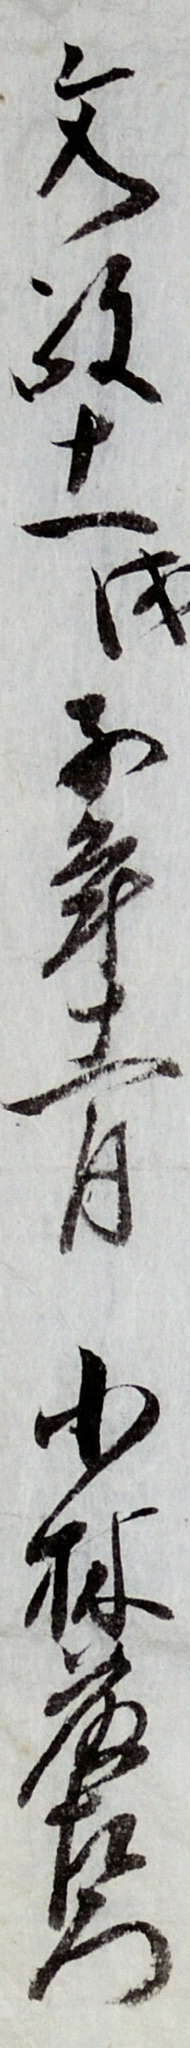文政十一戊子年十一月小林藤左衛門
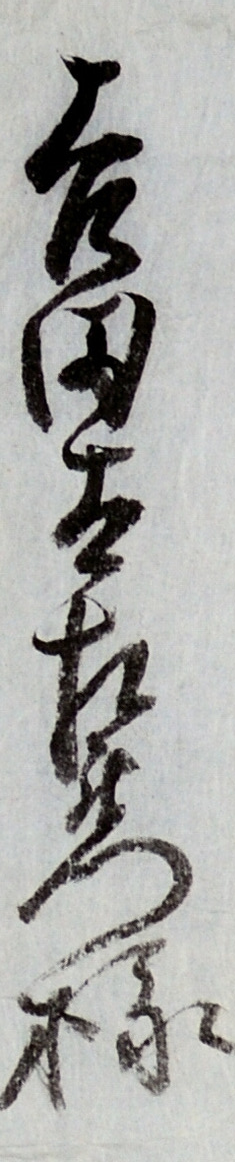吉田太左衛門様
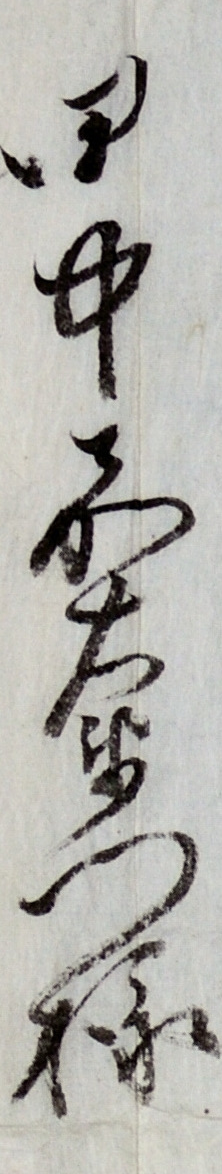田中嘉右衛門様
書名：覚
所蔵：伊那市立高遠町図書館・合同会社AMANE
